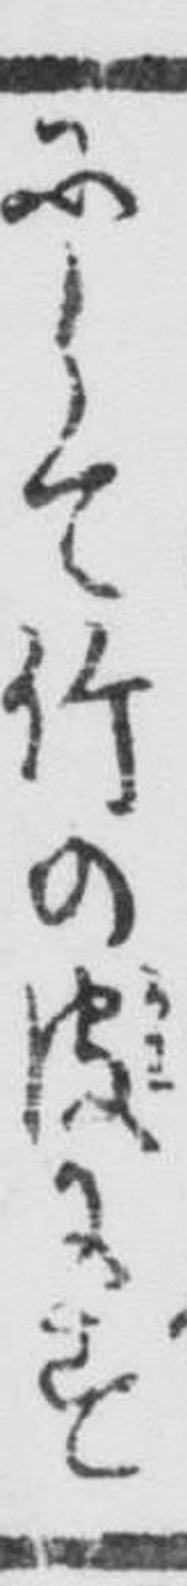にして竹の皮にす
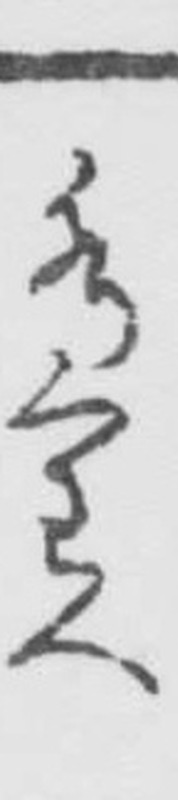水くわへ
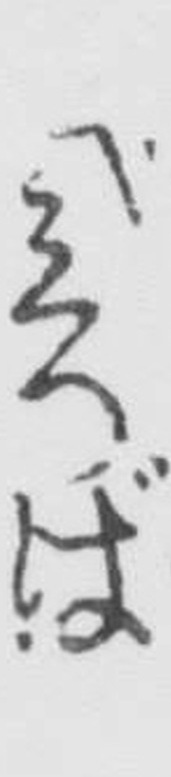〽みつば
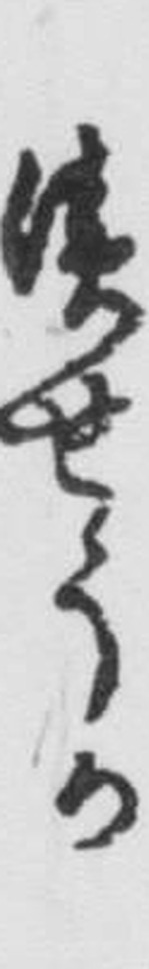漬せうか
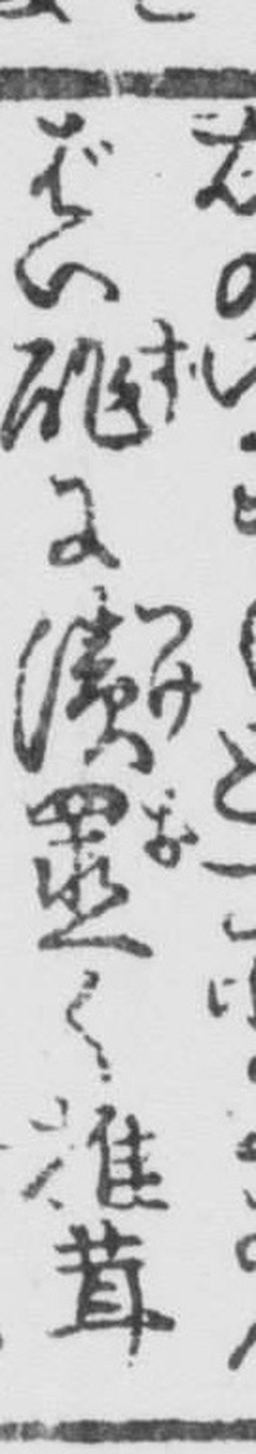ばい酢に漬置く椎茸
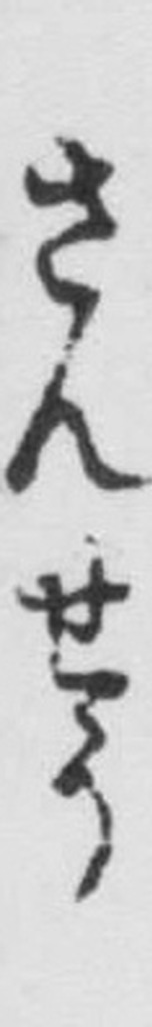さんせう
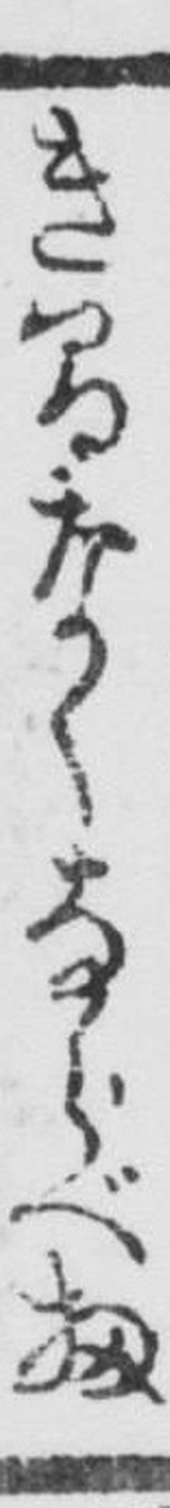き間なくならべ扨
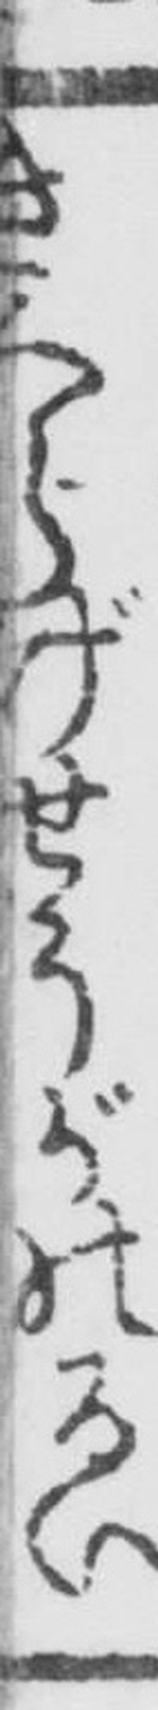きくらげせうがのるい

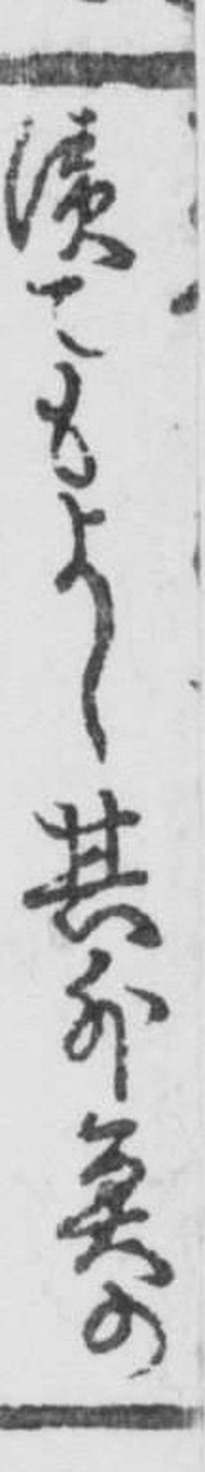漬てもよし其外魚の
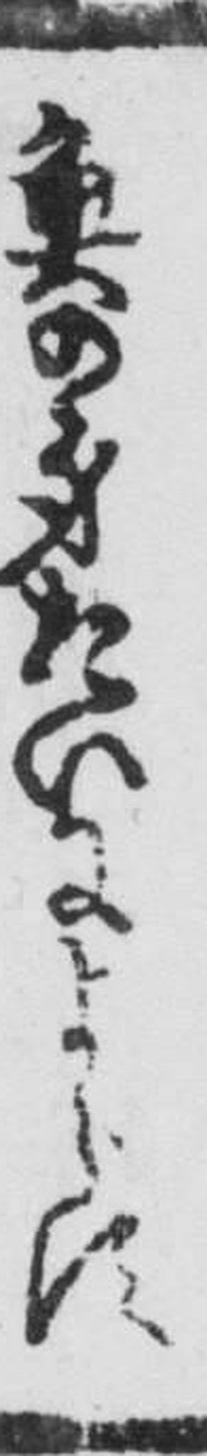魚の身たいによらす
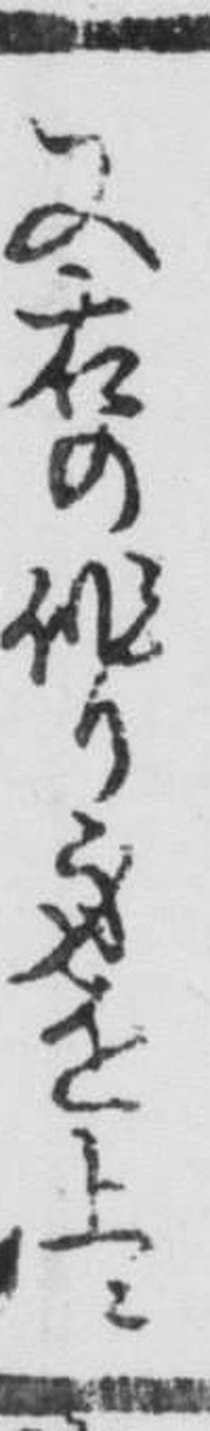又右の作り身を上に
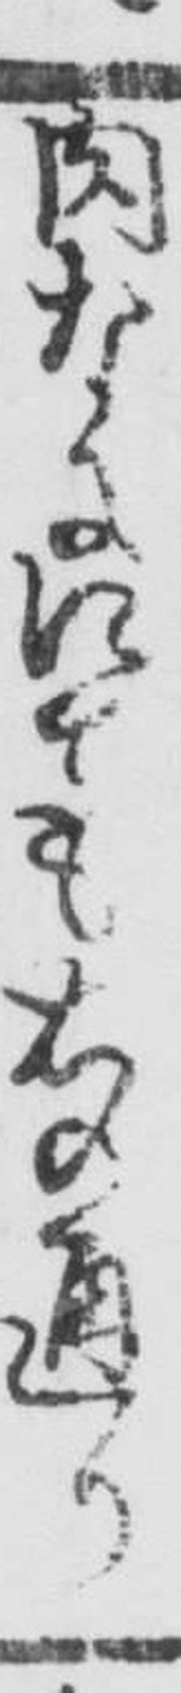肉なににても右の通り
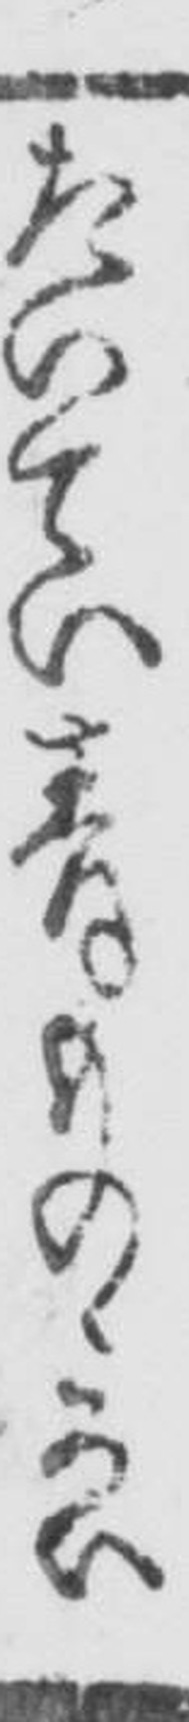たいてい青ものゝるい
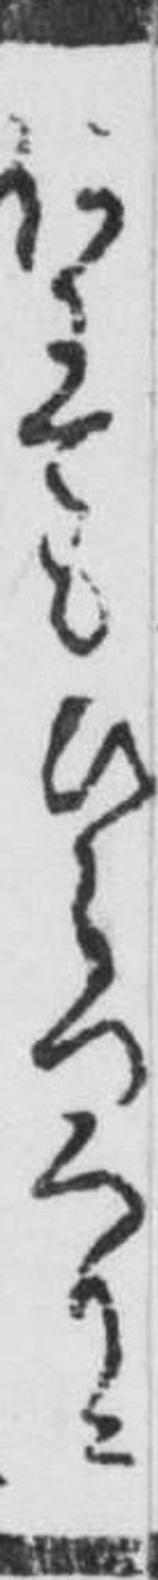何にてもひらつくりに
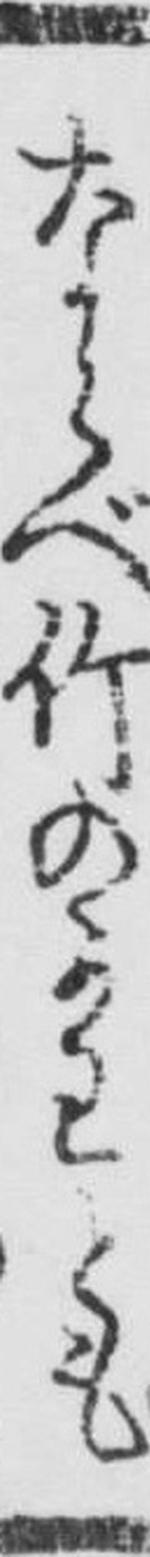ならべ竹のかわとも
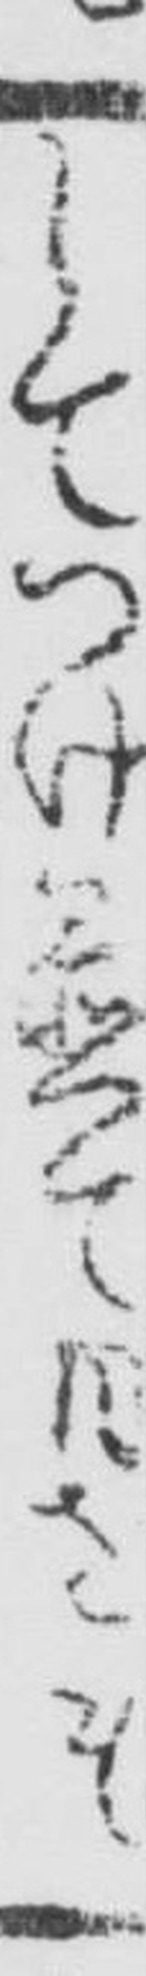してつけ置て白さも
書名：諸家通用/即席料理
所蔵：大阪府立大学学術情報センター 国文学研究資料館
